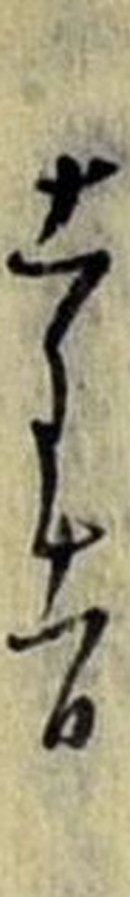十一月十一日
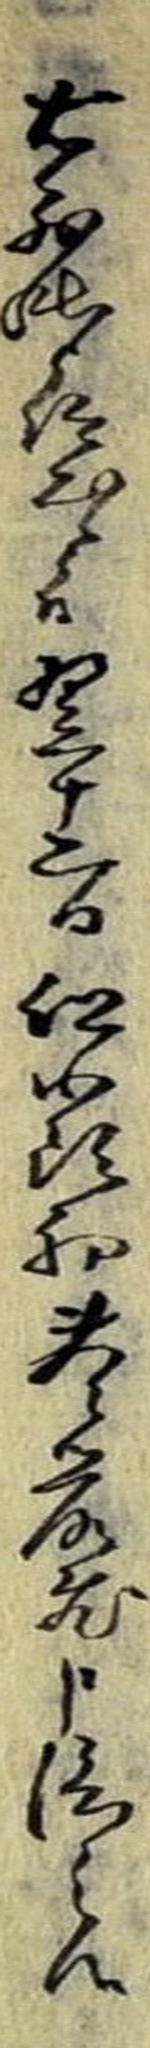○右別帳被仰出候に付翌十二日組小頭初外夫々厳敷申渡之候
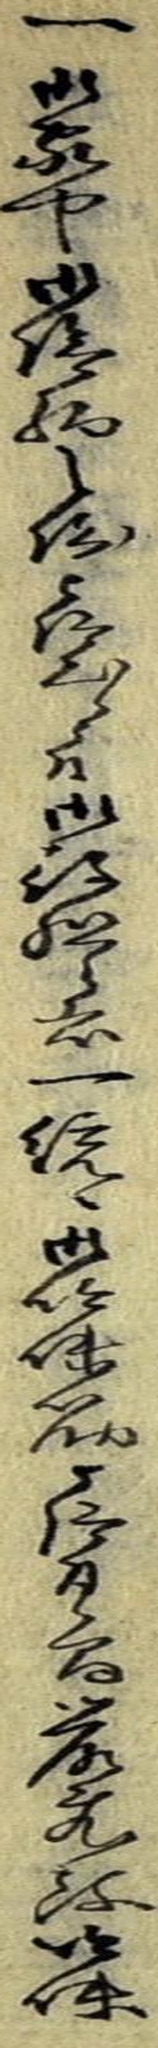一御家中御倹約之儀被仰出候に付御役組之者一統へ御吟味筋被仰付候間厳敷致吟味
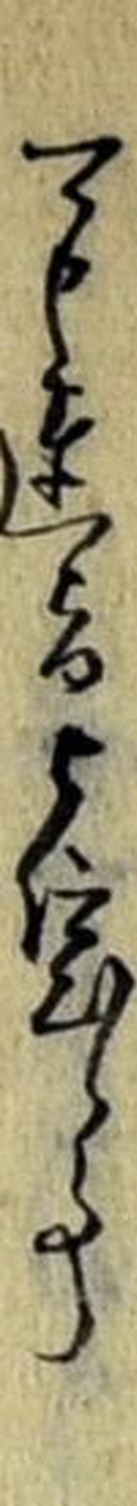可申達旨被仰出候事
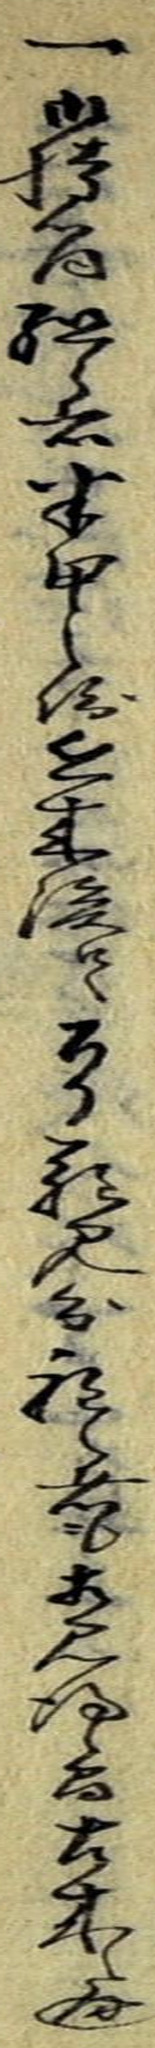一御持筒組之者半甲之儀近来後口之下り難見分程之者も相見得候間古来之通

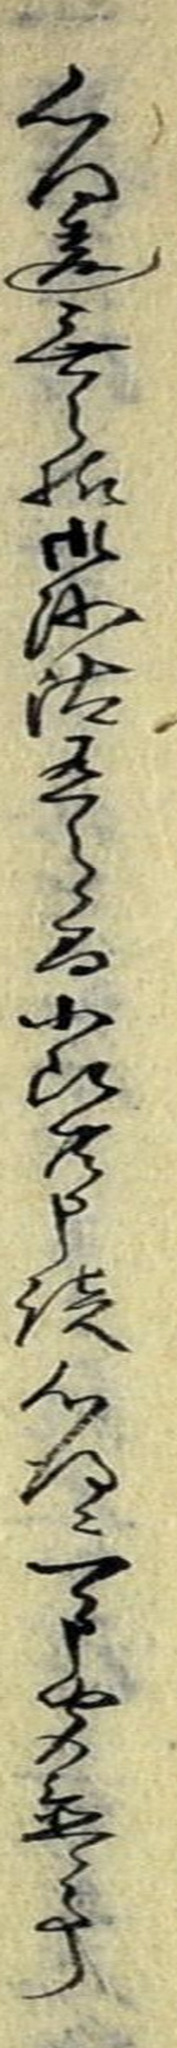心得違之無様御沙汰有之候間小頭共申談心得に可申聞置候事
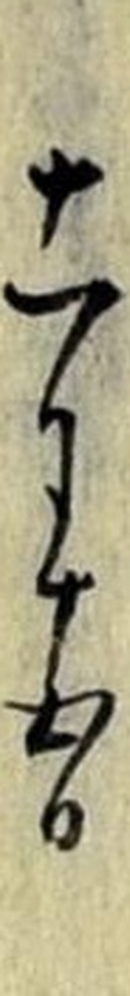十一月十五日
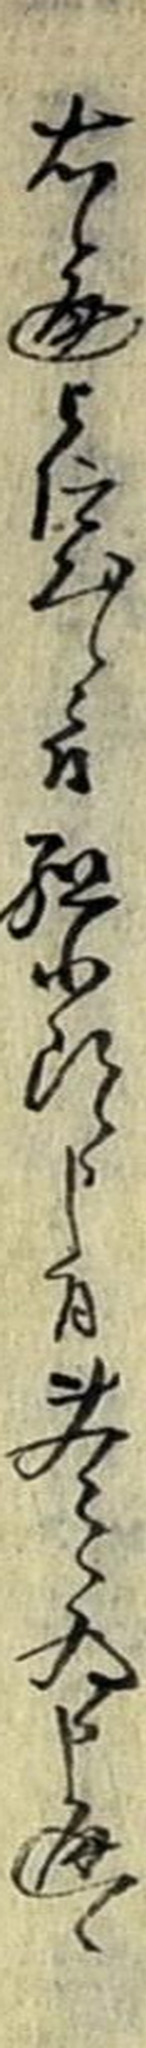右之通被仰出候に付組小頭申付夫々為申通候
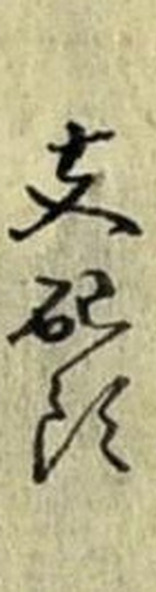支配頭
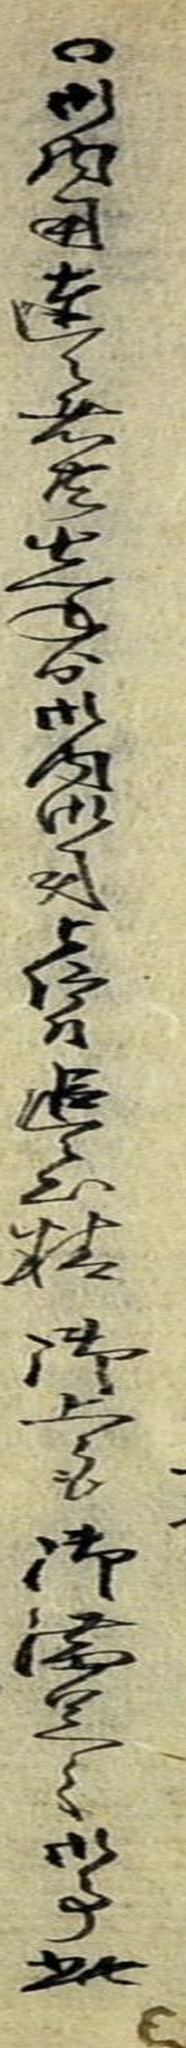○御内用達之者共先年ゟ御内御用被仰付追々出精御上にも御満足之御事此
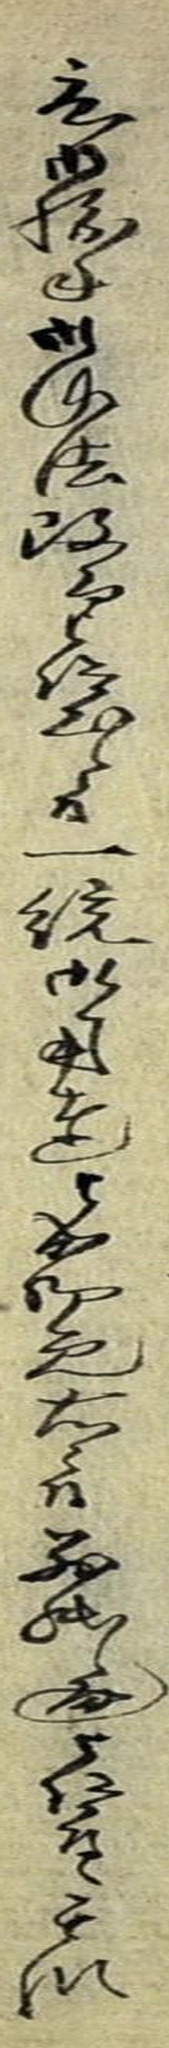度御勝手御趣法改而被仰出候に付一統御用達被成御免右に付別紙之通被仰付候其段
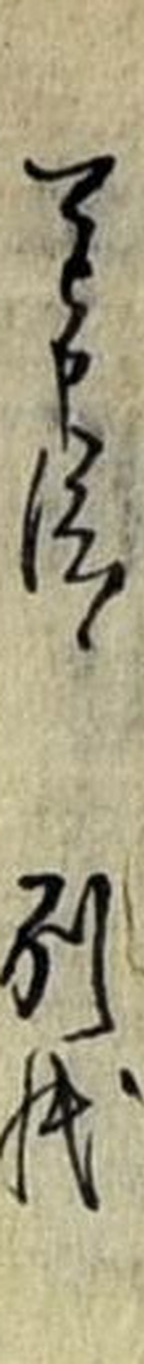可被申渡候別紙
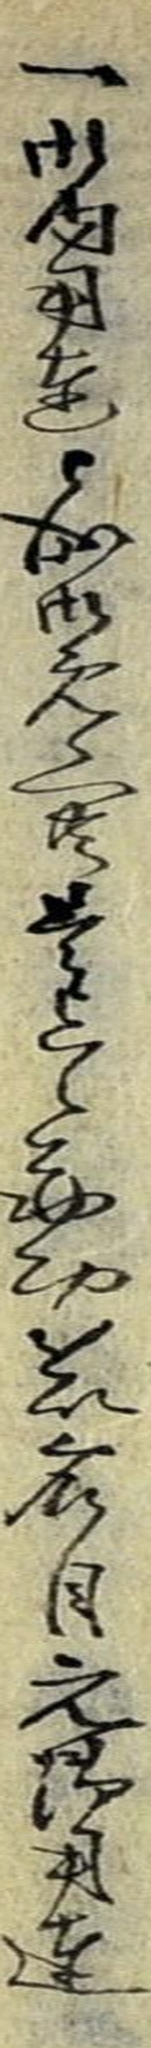一御内用達被成御免候へ共是迄之勤功を以名目元御用達
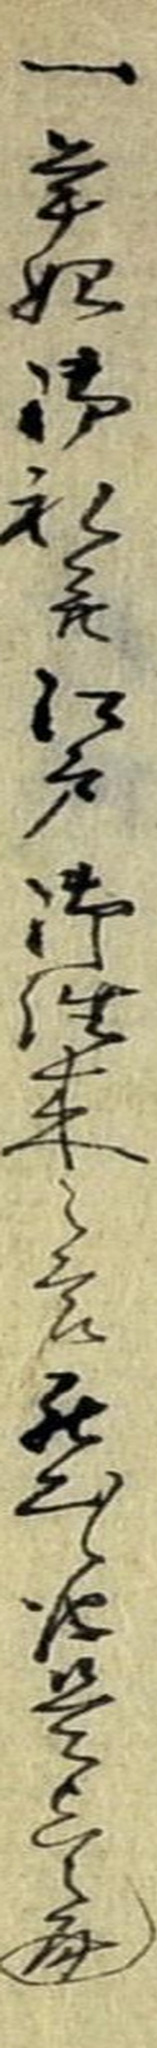一年始御礼并江戸御往来之節罷出候儀是迄之通
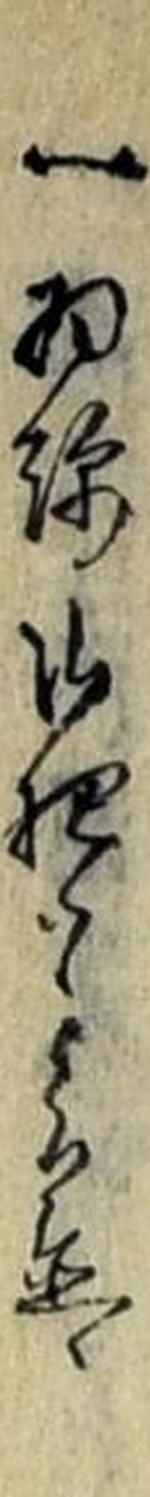一初綿弐把つヽ被下置候
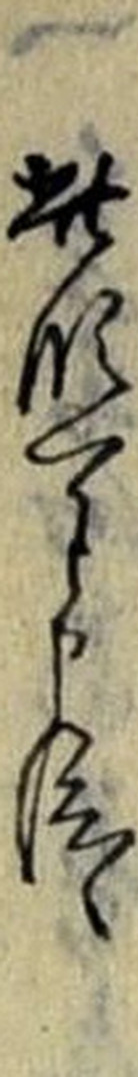此段可申渡候
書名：命令之部 四
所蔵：福井県文書館 Fukui Prefectural Archives
